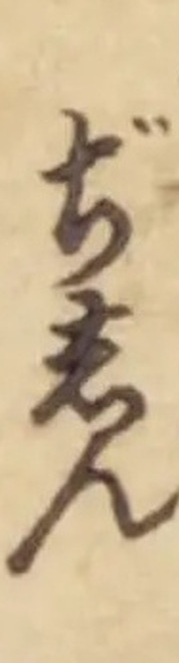ぢしん
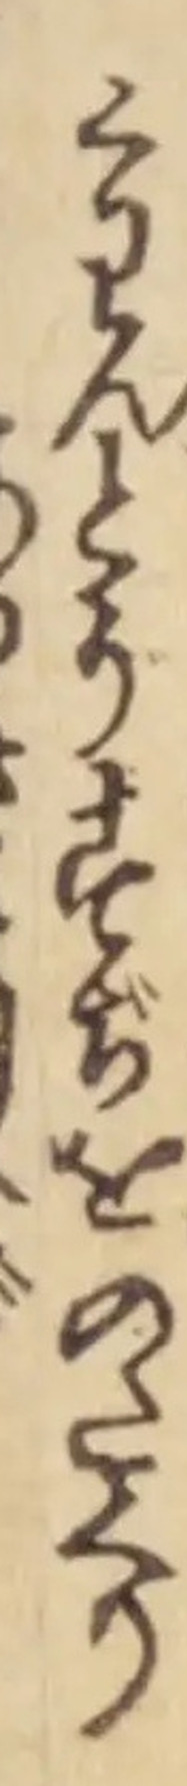くわんとうすぢをのたくり
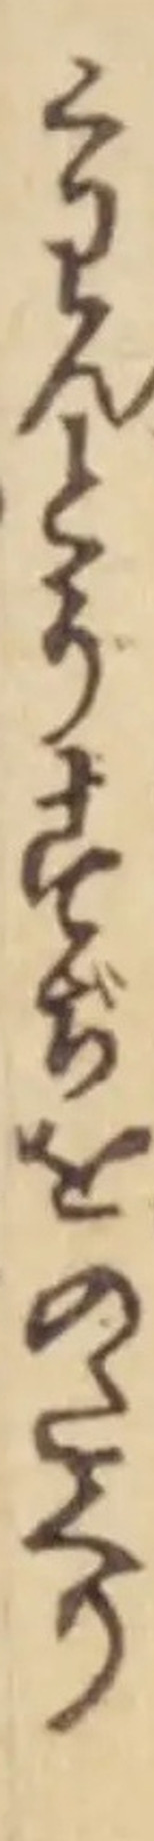くわんとうすぢをのたくり
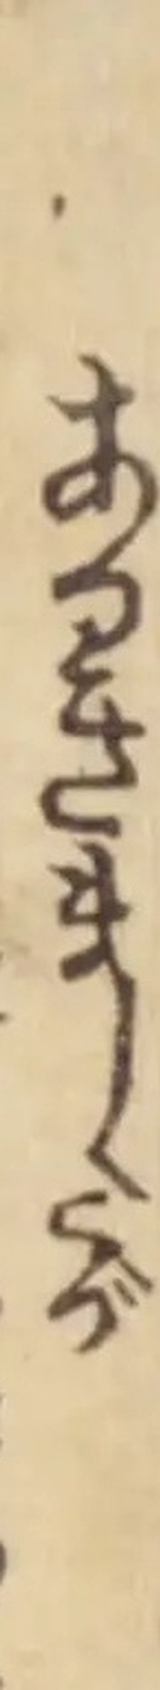あるきましたが
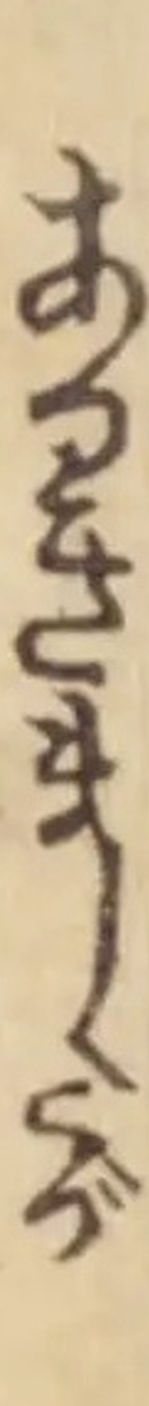あるきましたが
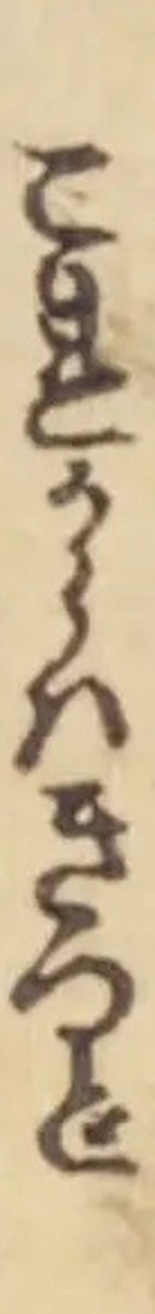これからはきつと
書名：（地震鯰の取調べ）
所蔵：国立国会図書館 National Diet Library, JAPAN
